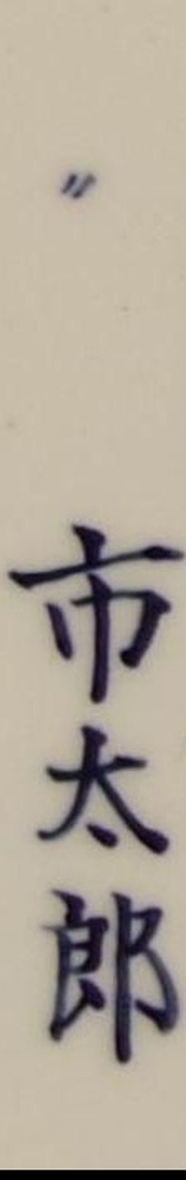市太郎
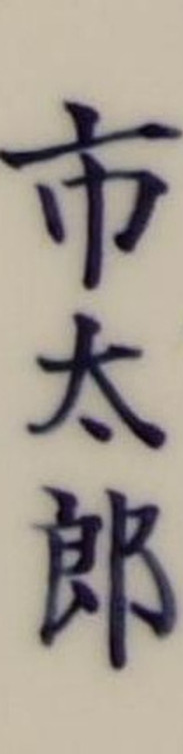市太郎

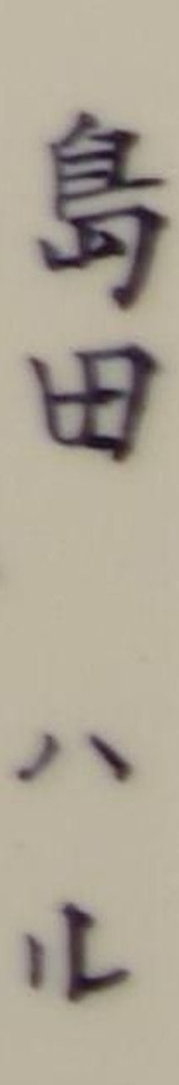島田ハル
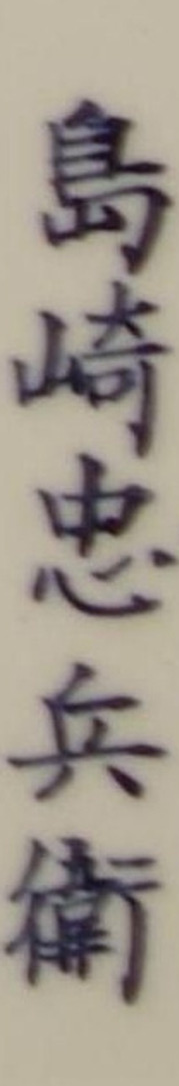島崎忠兵衛
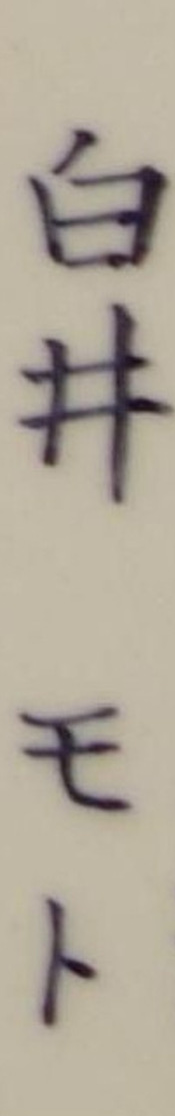白井モト
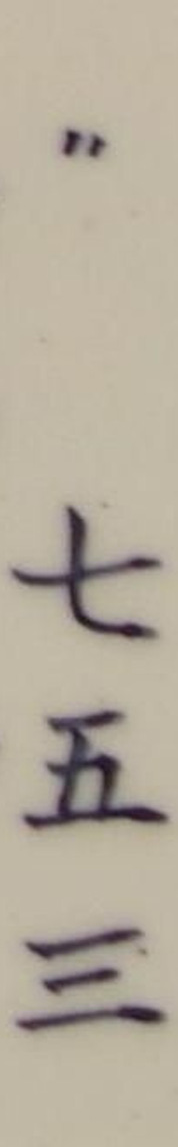七五三
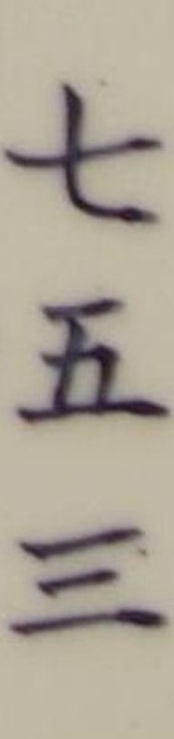七五三
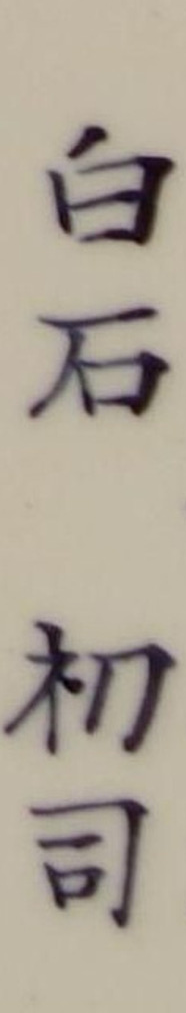白石初司
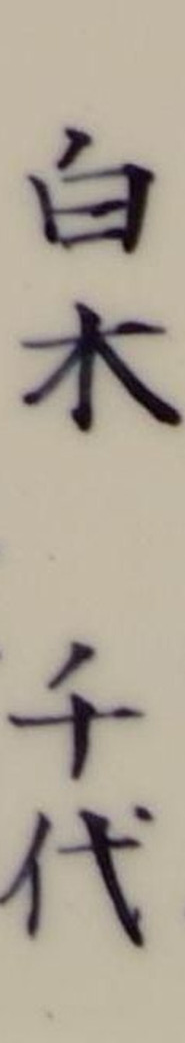白木千代
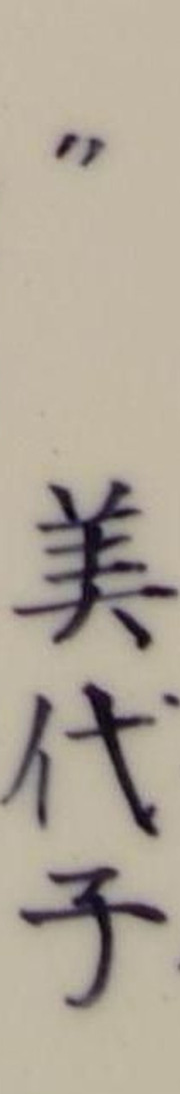美代子
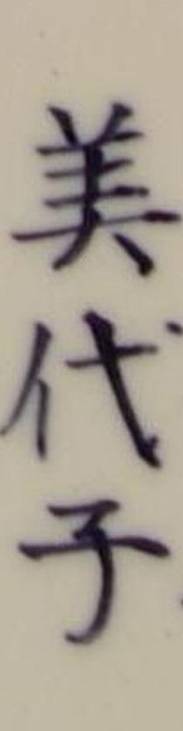美代子
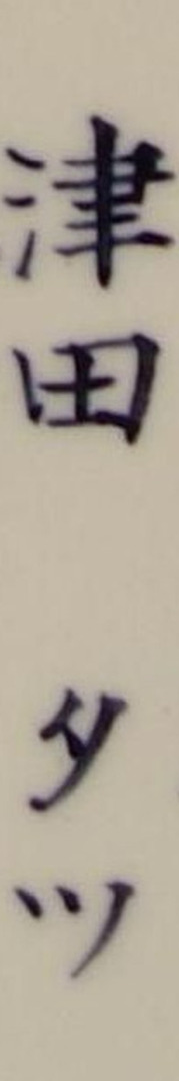津田タツ
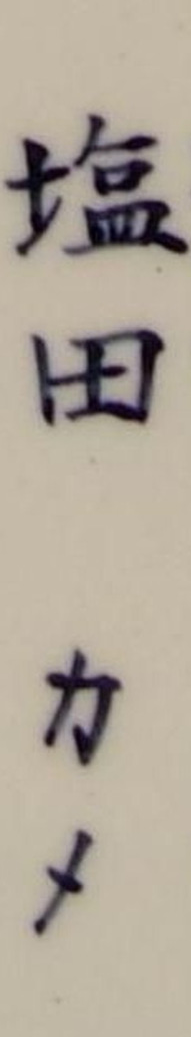塩田カメ
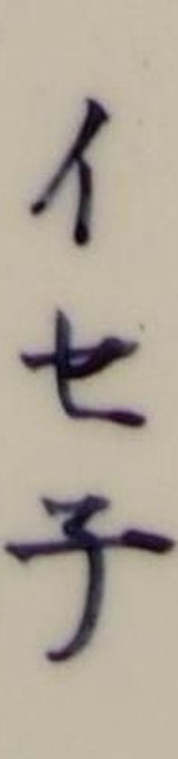イセ子
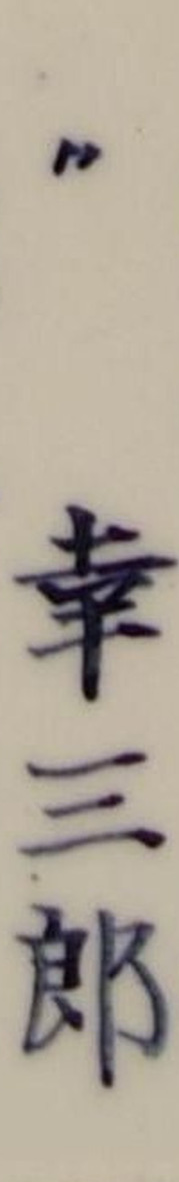幸三郎
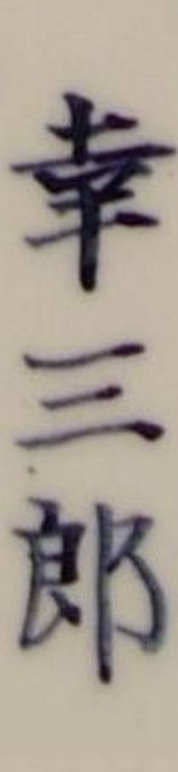幸三郎
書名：M~S
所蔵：高野山金剛峯寺
